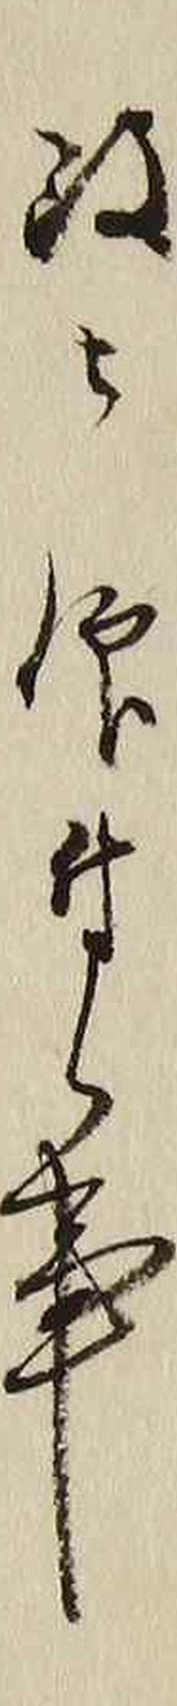頭被仰付候事
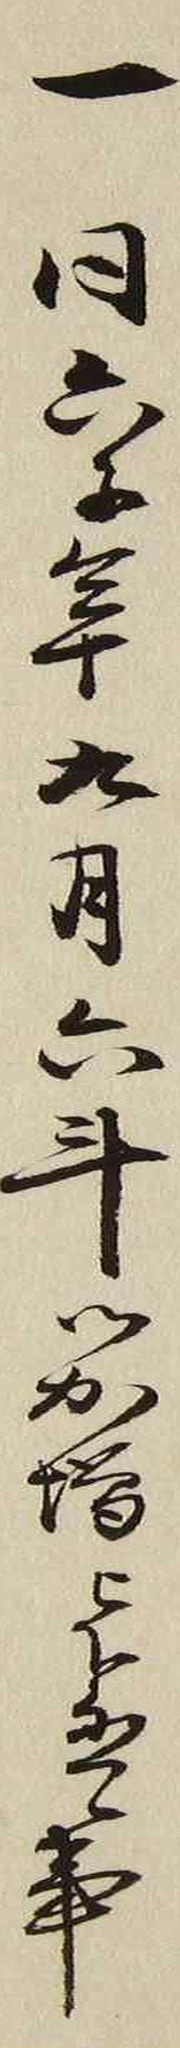一同六子年九月六斗御加増被下置候事
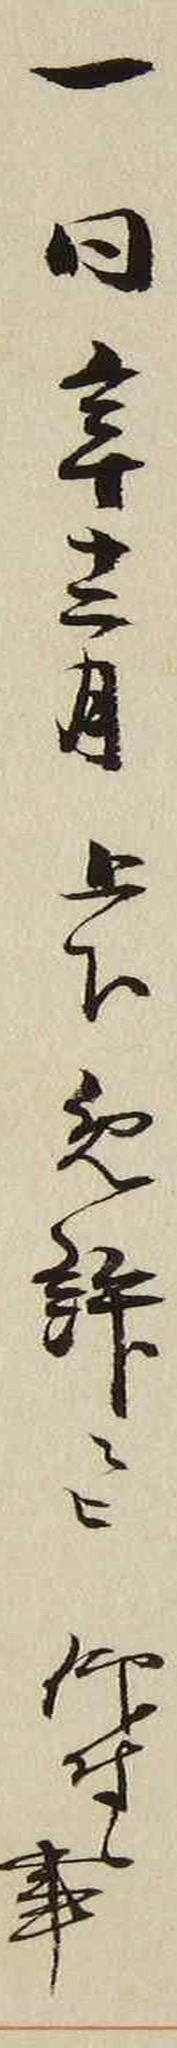一同年十二月上下免許ニ被仰付候事
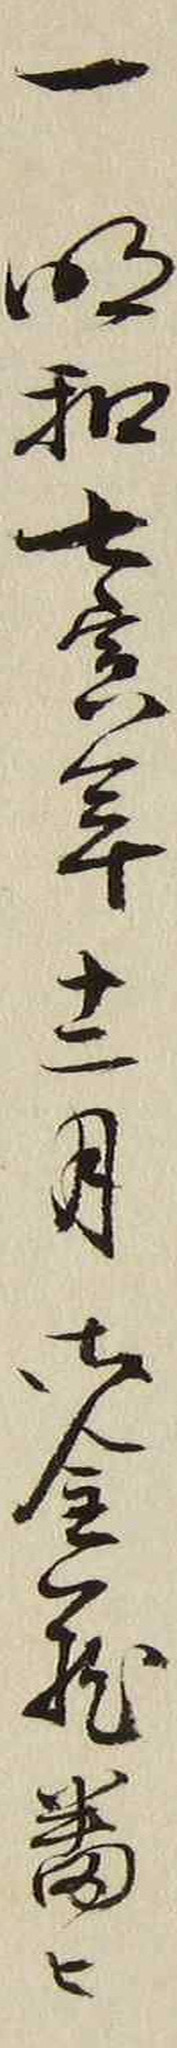一明和七寅年十二月御金蔵番被
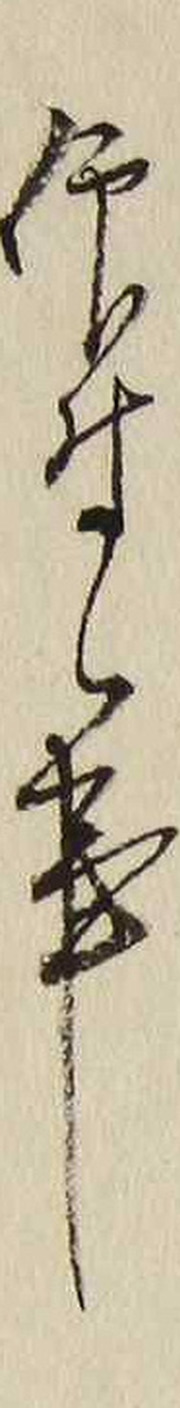仰付候事
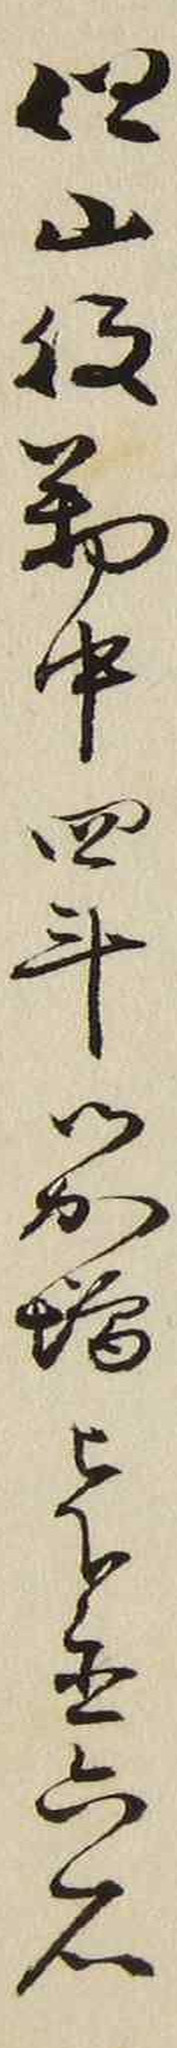但山役勤中四斗御加増被下置六石

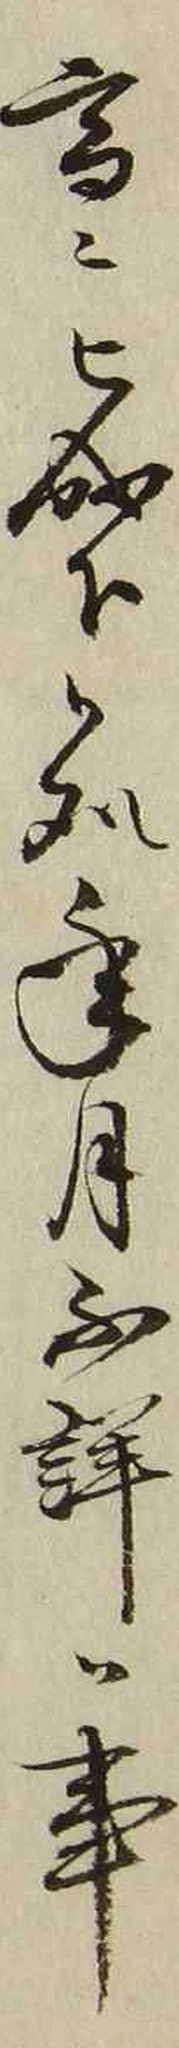高ニ被成下候処年月不詳候事
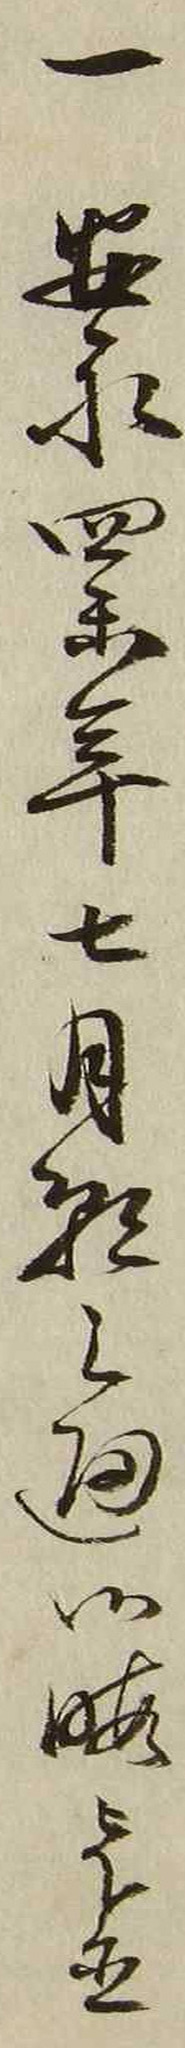一安永四未年七月願之通御暇被下置
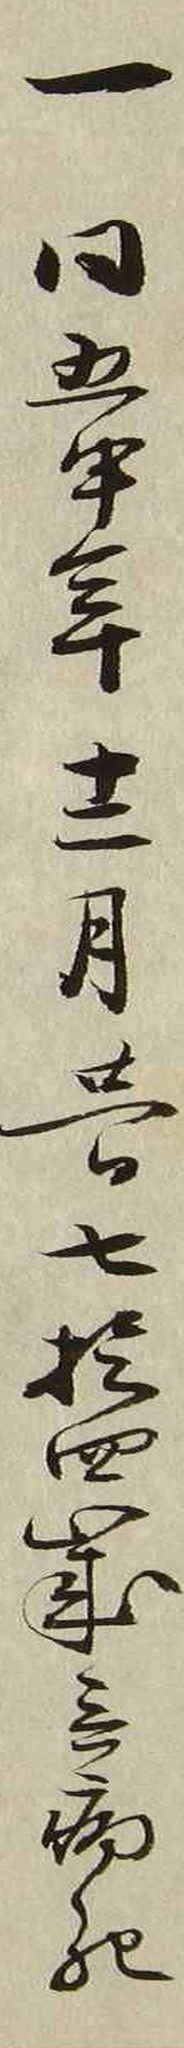一同五申年十二月廿一日七拾四歳ニ而病死
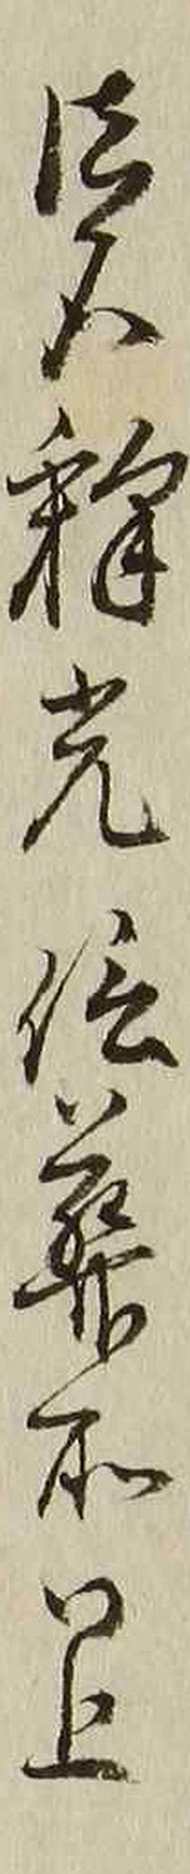法名釈光信葬所同上
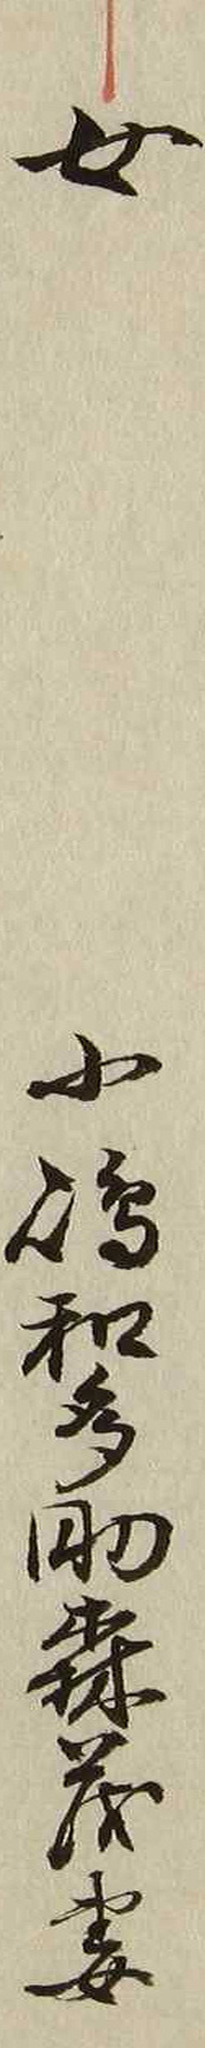女小島和多助森茂妻
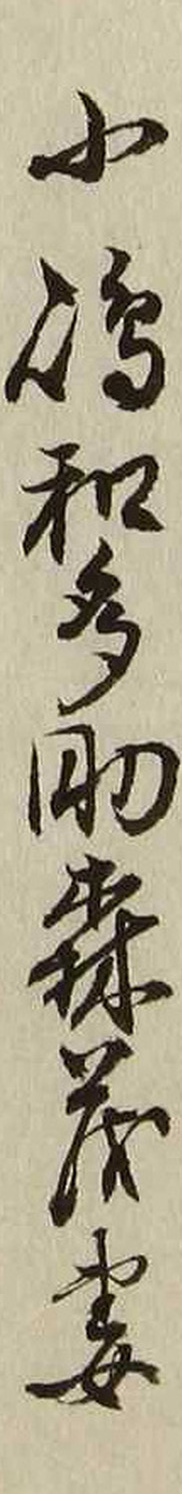女小島和多助森茂妻
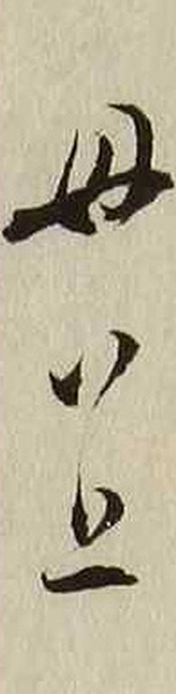母同上
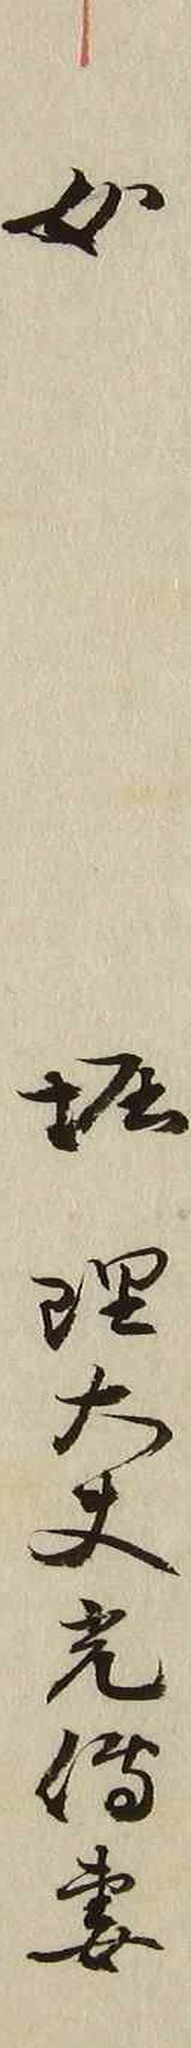女堀理大夫光伝妻
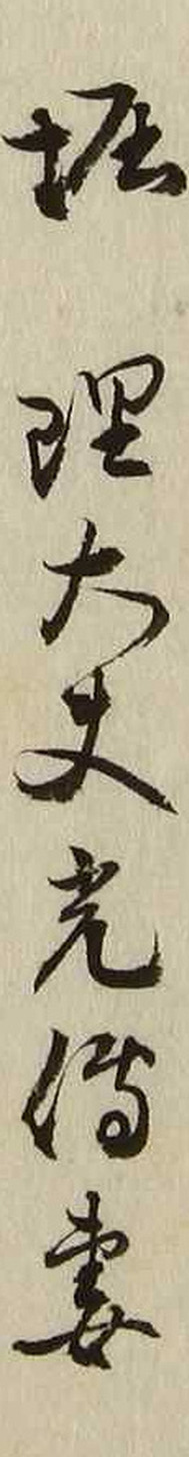女堀理大夫光伝妻
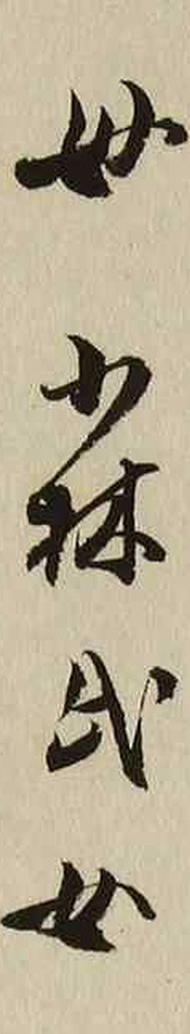母小林氏女
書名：諸士系譜　巻之291　さ之部23
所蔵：会津若松市立会津図書館
